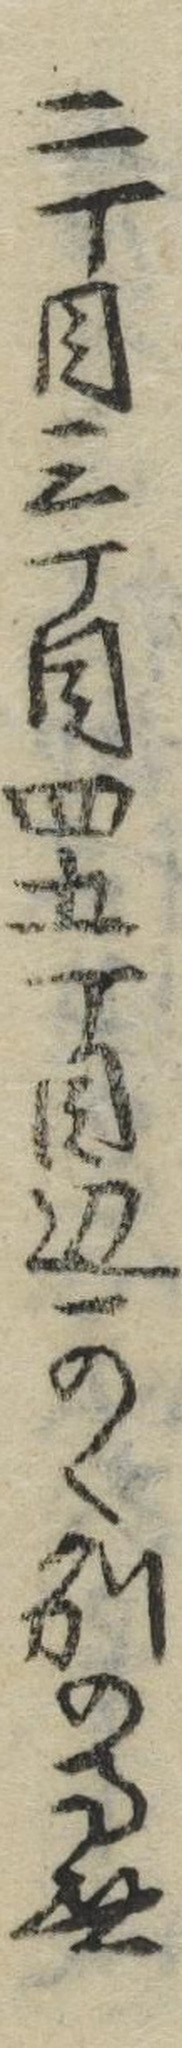二丁目三丁目四五丁目辺かく別の事無
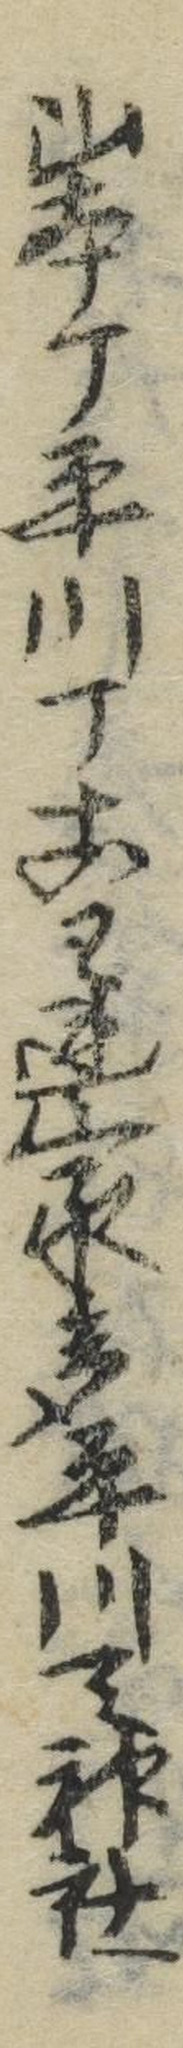山本丁平川丁こわれ家多平川天神社
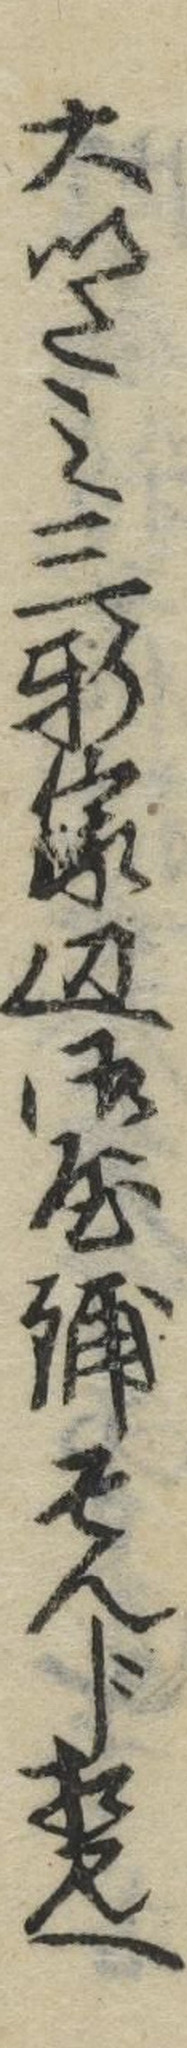大いたミ三軒家辺御屋舗そんじ相見へ
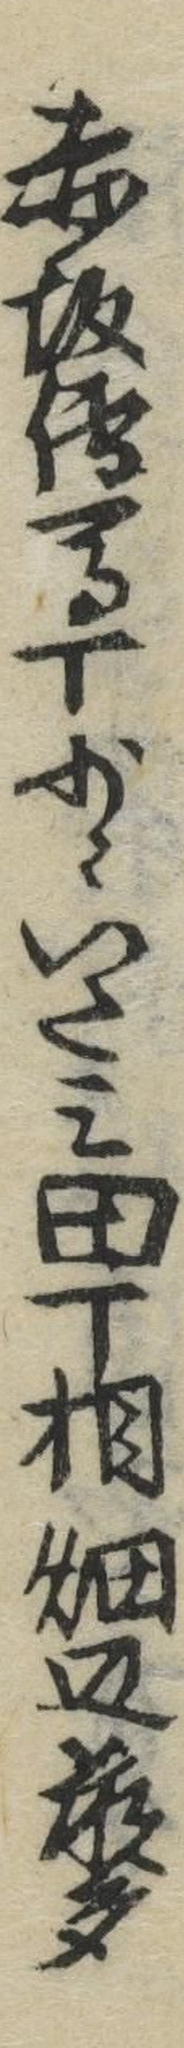赤坂伝馬丁少〻いたミ田丁相畑辺崩多
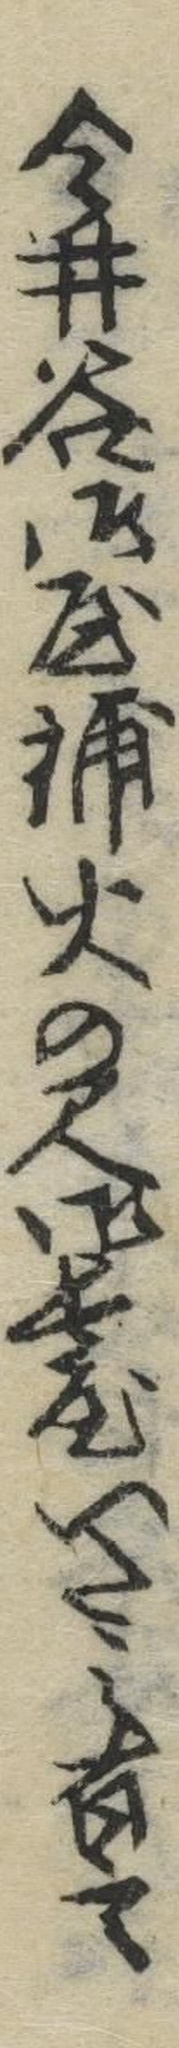今井谷御屋舗火の見御長屋いたミ有之
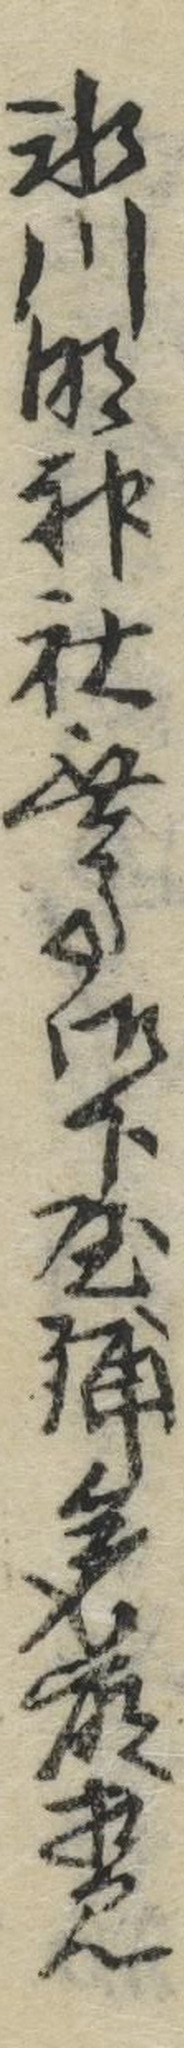氷川明神社無事御下屋敷多崩相見
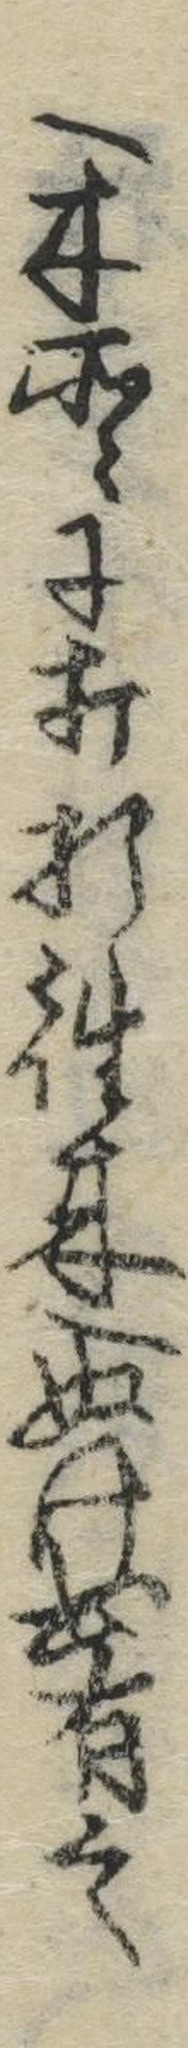へ木所〻に打折往来へぬけ出有之
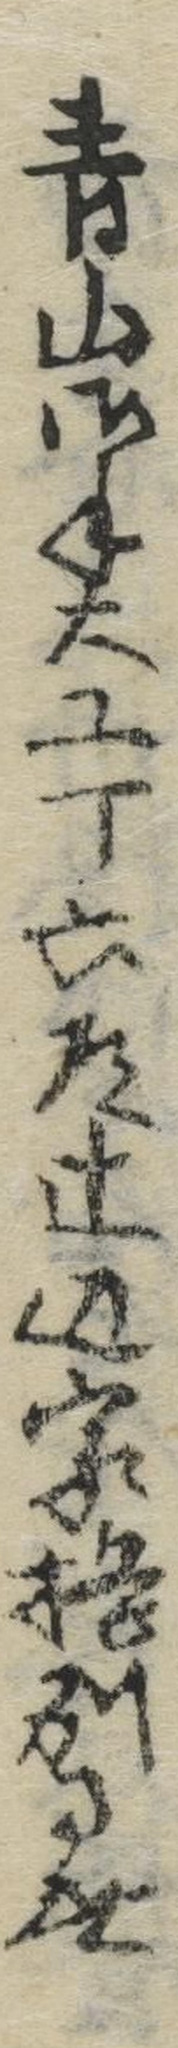青山御手大工丁六道辻辺家格別事無
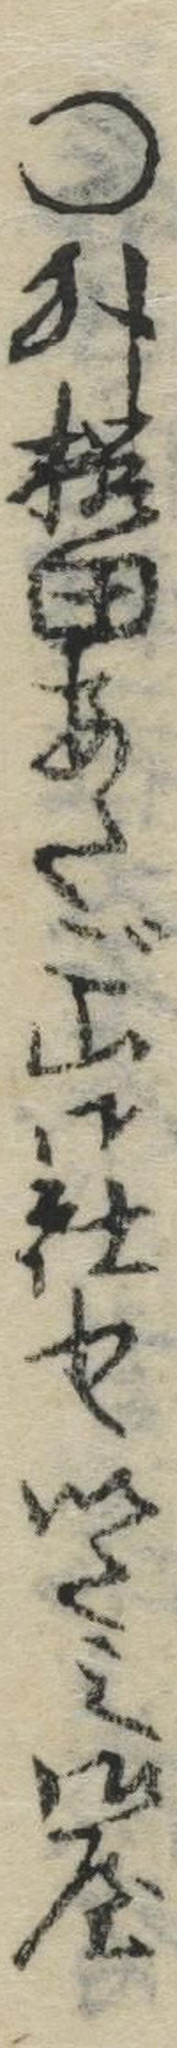〇外桜田あたご山御社やゝいたミ御屋
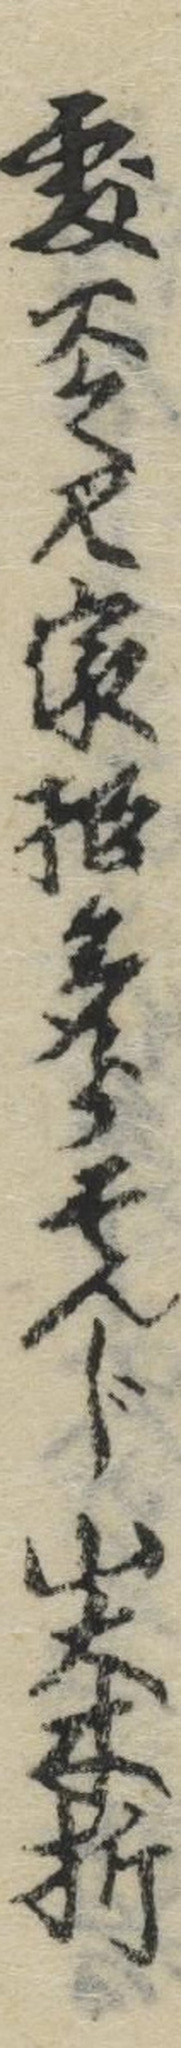敷火之見家根多分そんじ山大木折
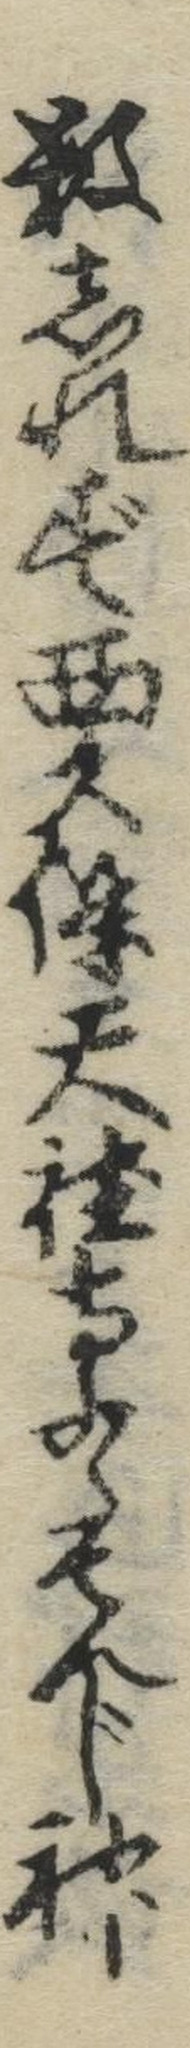数しれず西久保天徳寺少〻そんじ神
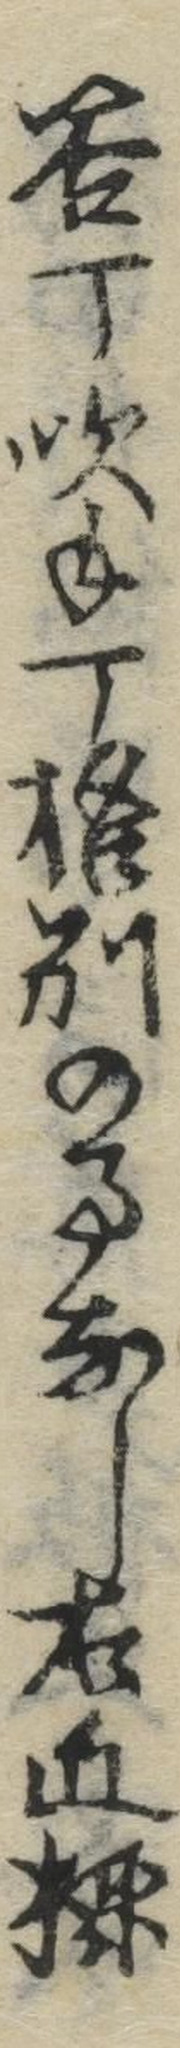谷丁吹手丁格別の事なし右近様
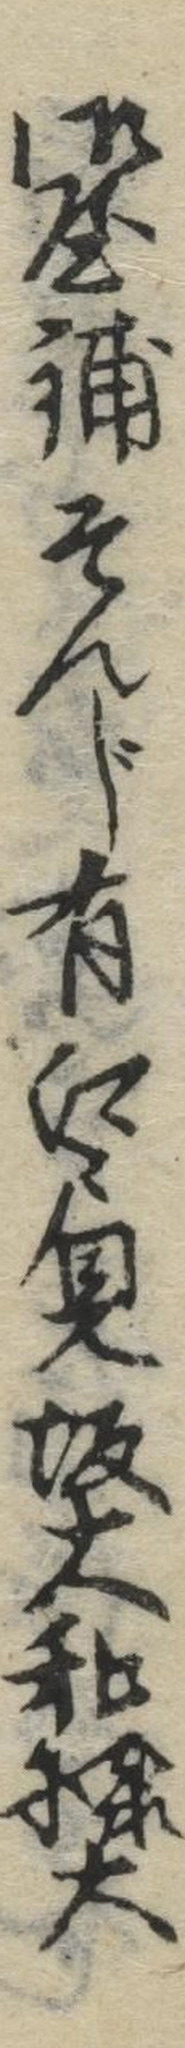御屋舗そんじ有江戸見坂大和様大
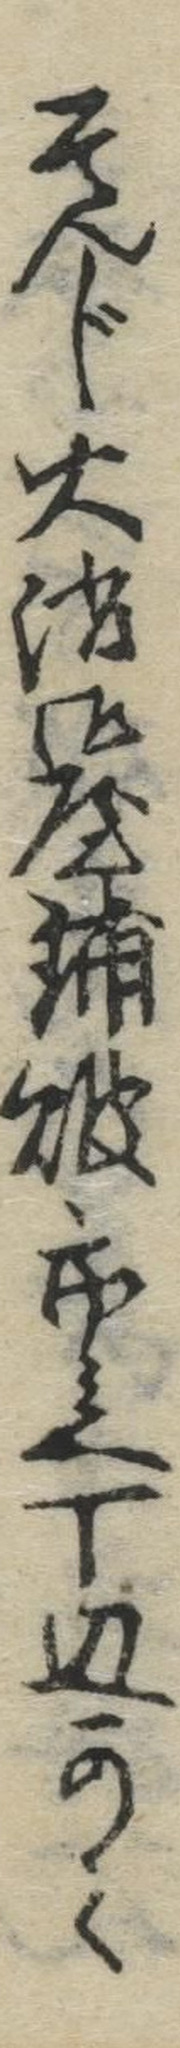そんじ火消御屋舗破市宮丁辺かく
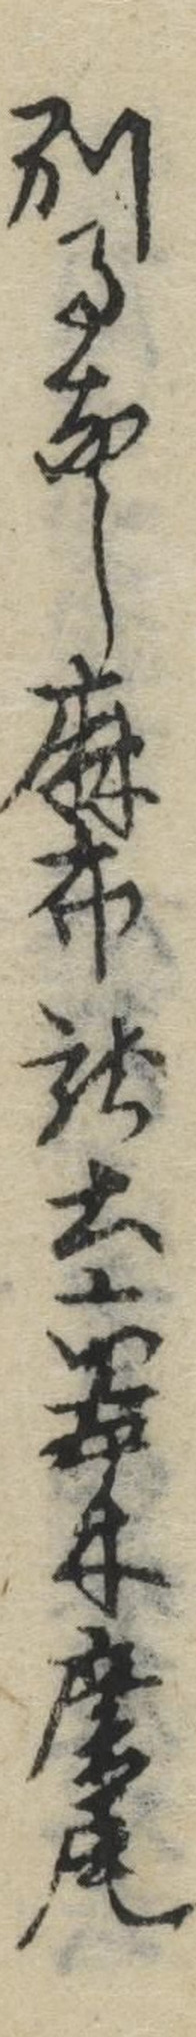別事なし麻布龍土六本木広尾
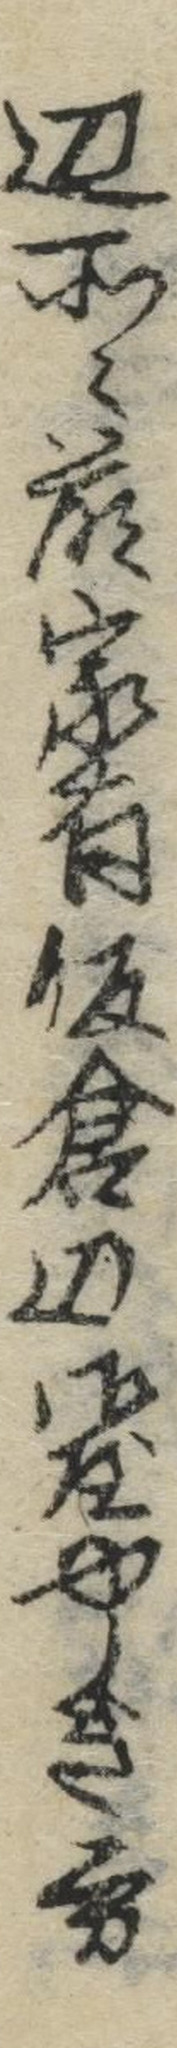辺所〻崩家有仮倉辺御屋やしき旁
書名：安政三年辰八月廿五日夜　大江都御屋敷方寺社市中共　大嵐水入場所明細書之寫　并街道筋近郷聞書
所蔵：東京大学地震研究所図書室 Earthquake Research Institute Library, The University of Tokyo, JAPAN
